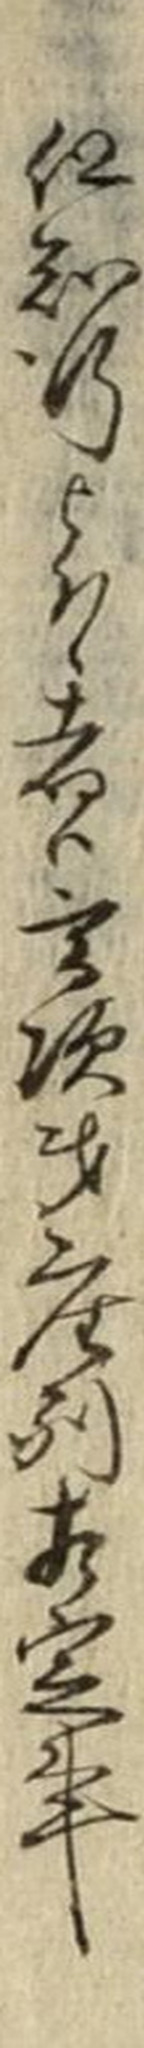但知行被下候者は年次第座列相定候事
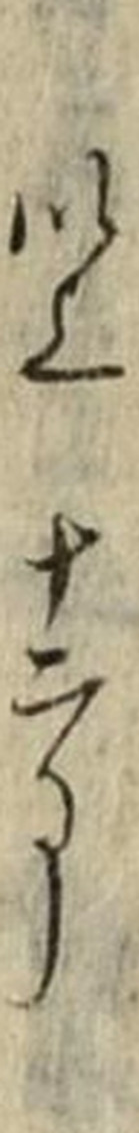以上十二月
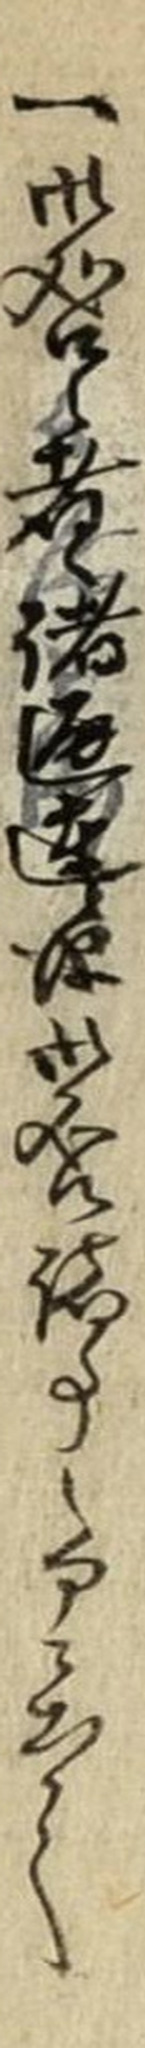一御咎之者諸通達之儀御咎諸事之部に出之
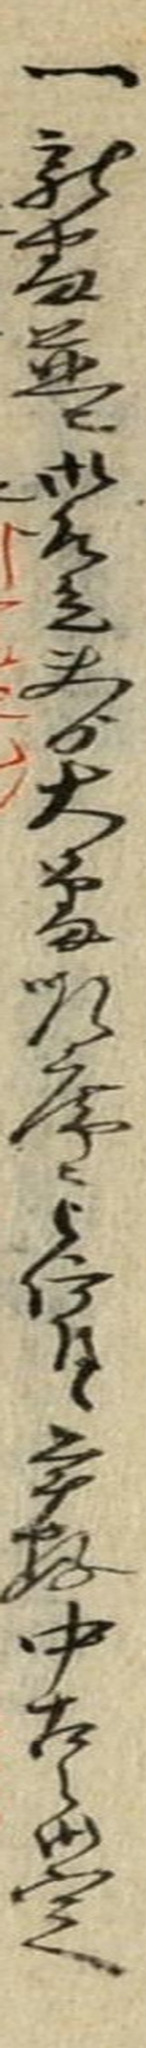一新番並に御取立夫ゟ大番順席に被仰付候年数中左之御定
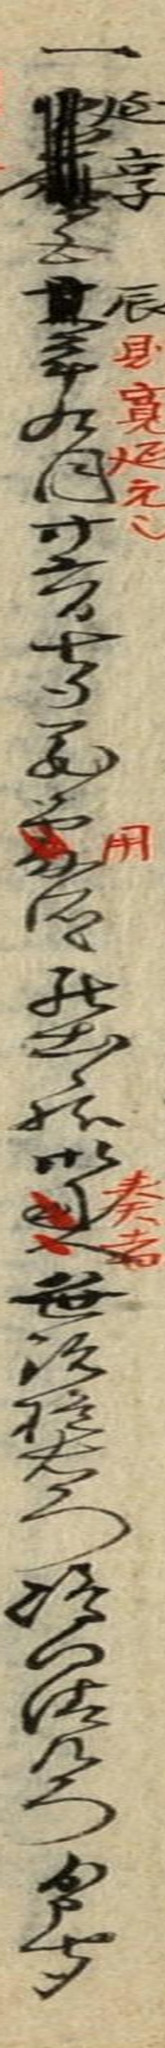一延享五辰年則寛政元也九月廿六日七ッ蔵御用所へ罷出候様御奏者笹治権右衛門嶋田清左衛門ゟ申聞
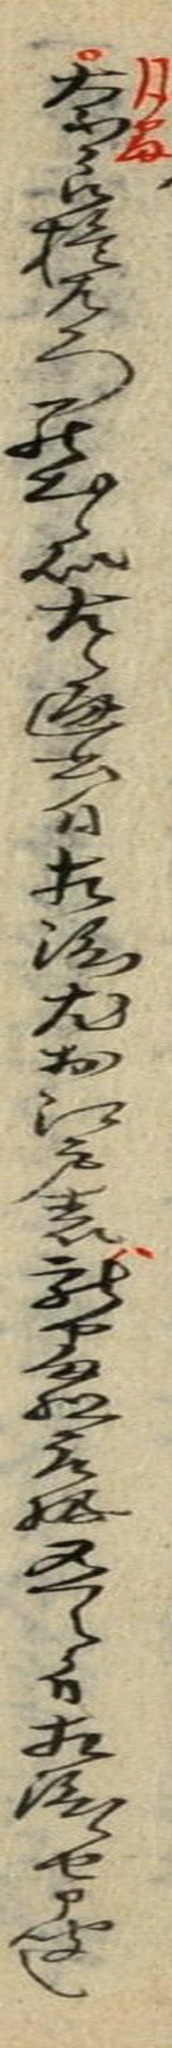月番奈良権左衛門罷出候処左之通書付相渡尤於江戸表新番組取扱有之候に付相渡候由申聞之
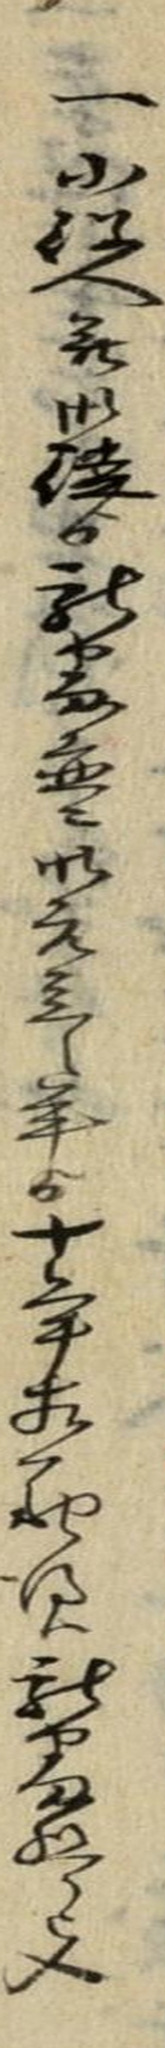一小役人并徒ゟ新番並に御取立之年ゟ十年相勤候得は新番組へ被入
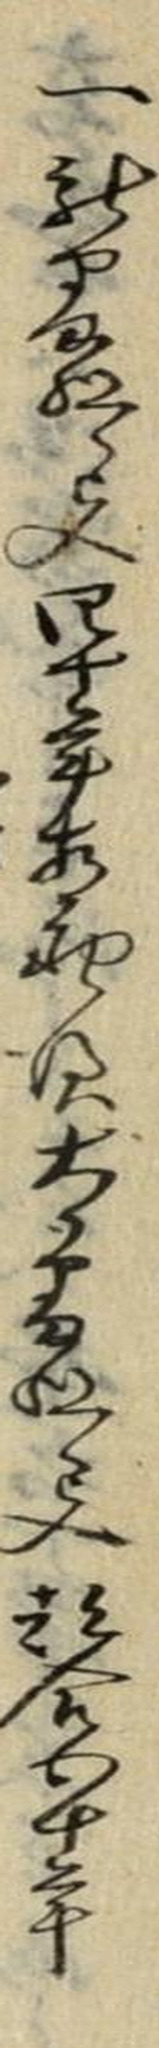一新番組へ被入四十年相勤候得は大御番組へ被入都合五十年
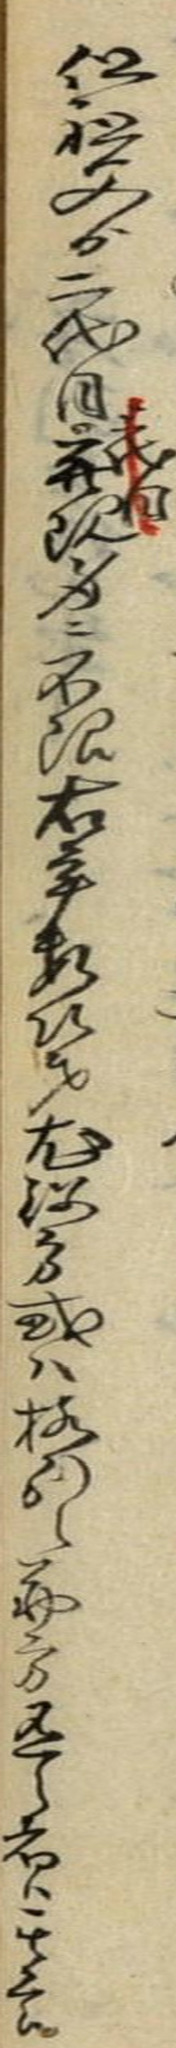但祖父ゟ二代目并現身に不限右年数次第尤役方或は各別之勤方有之者は其節
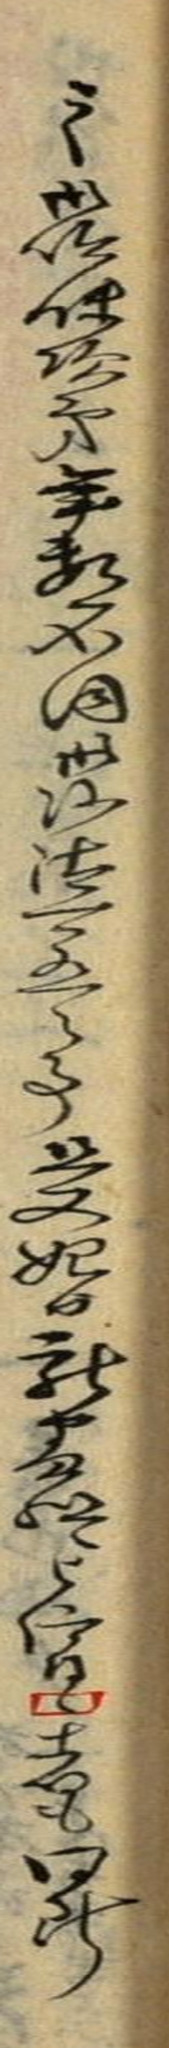之御吟味次第年数不用御沙汰可被有之候事且又始ゟ新番組へ被仰付候者も同断
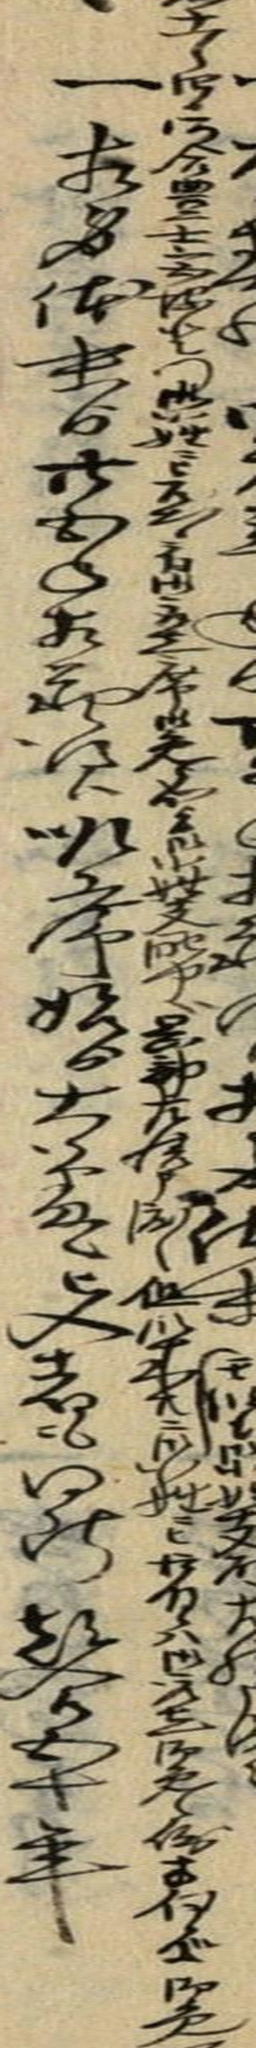一相身体未ゟ廿五年相勤候得は順席始ゟ大御番へ被入候者も同断都合五十年
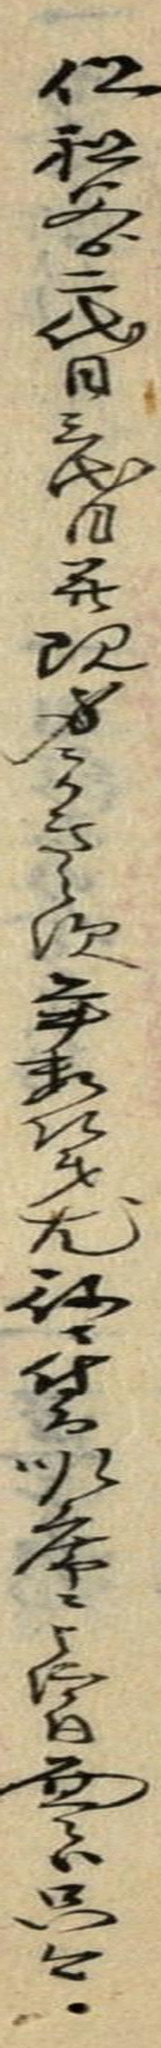但祖父ゟ二代目三代目并現身にかきらす年数次第尤役に就而順席に被仰付面々は只今
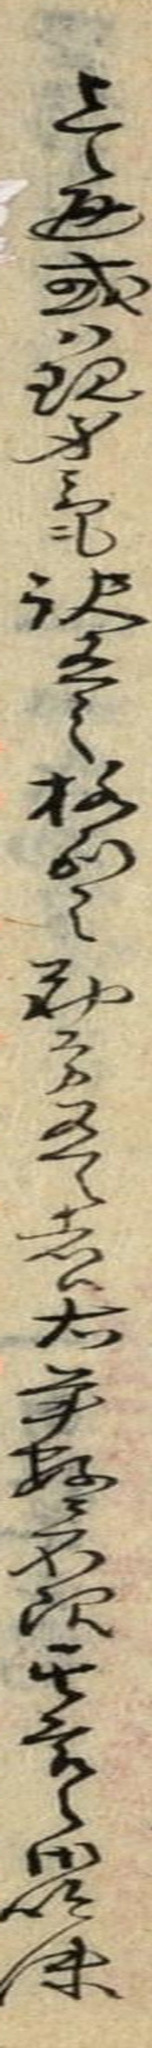迄之通或は現身に而も訳有之格別之勤方有之者は右年数に不限其節之御吟味
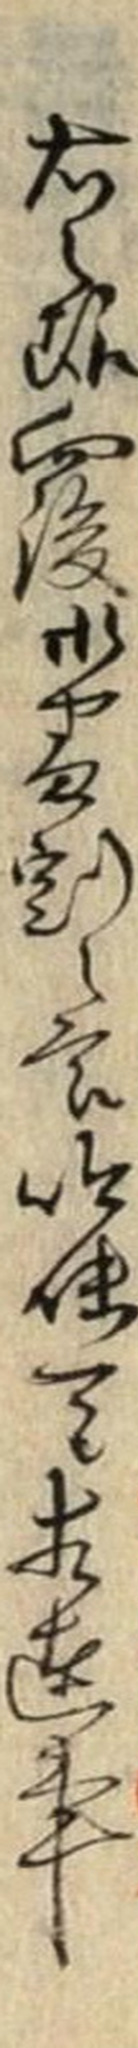右之趣向後御番割之節吟味可被相達候事
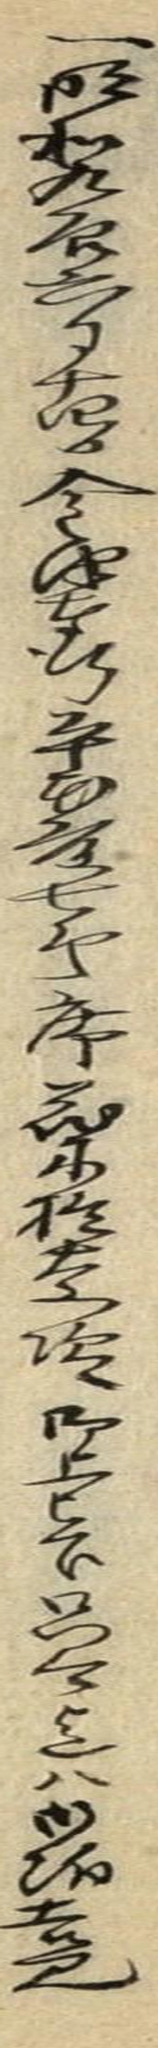一明和九辰六月十四日金津奉行平本藤七郎席花木権太夫次へ御上被下只今迄は御附吉見
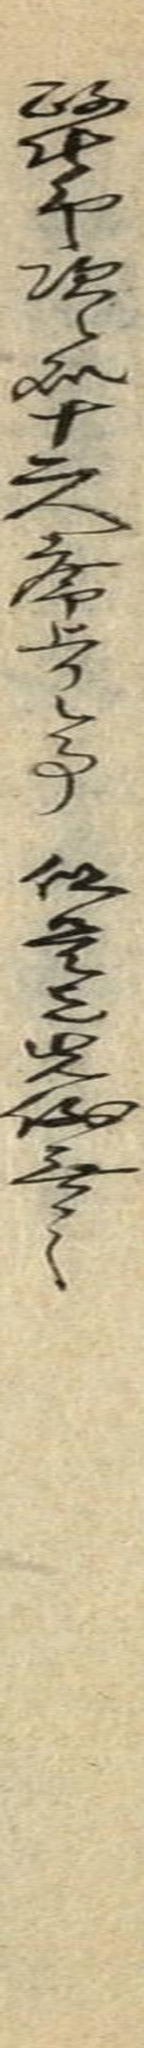政次郎次之処十二人席上り候事但是迄先例無之
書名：御用并被仰出之部
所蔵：福井県文書館 Fukui Prefectural Archives
